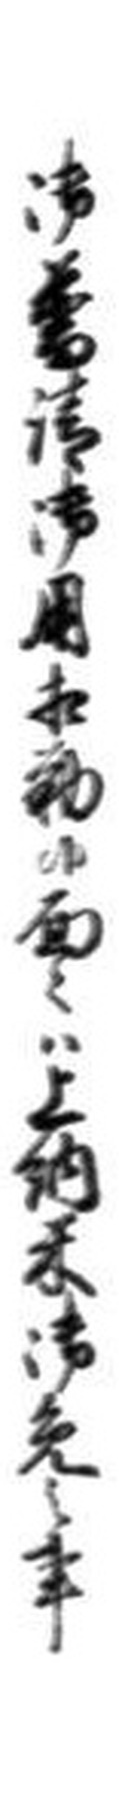御普請御用相勤候面々ハ上納米御免之事
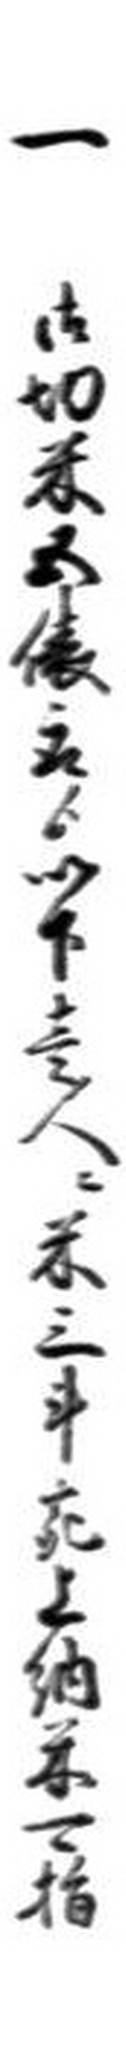一御切米五俵取ゟ以下壱人ニ米三斗宛上納米可指
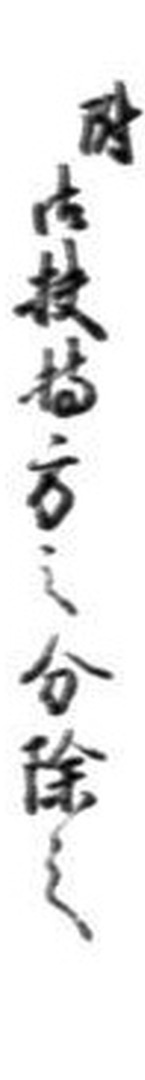御扶持方之分除之
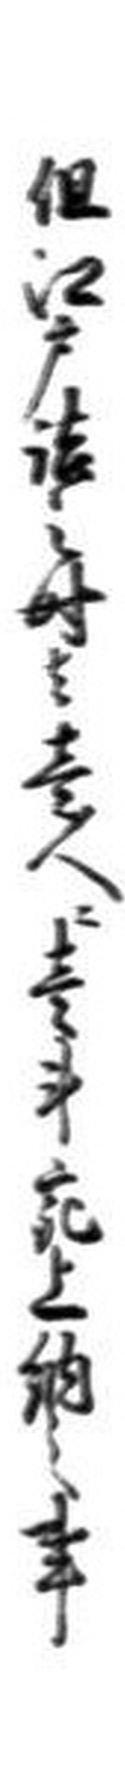但江戸詰之時者壱人ニ壱斗弐升宛上納之事
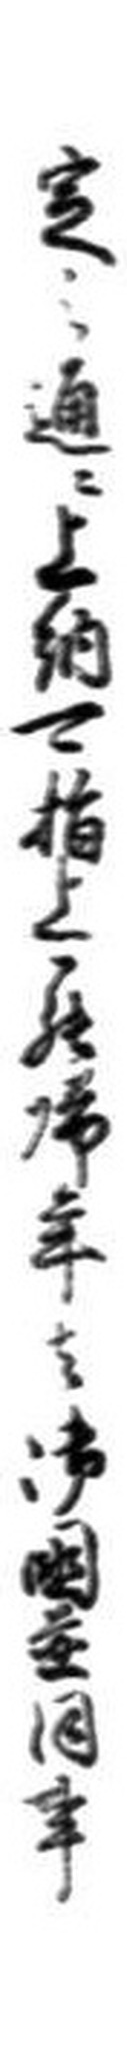定之通ニ上納可指上罷帰年者御国並同年

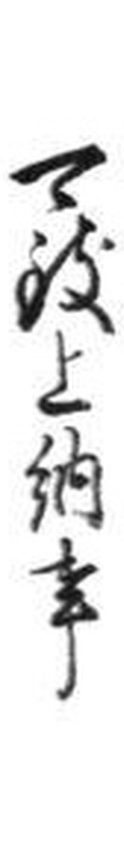可致上納事
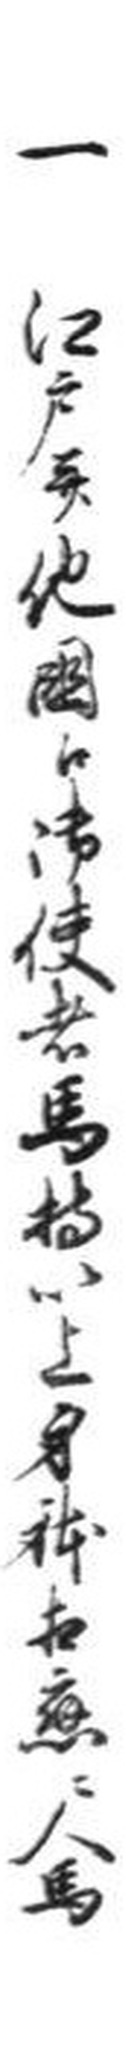一江戸并他国江御使者馬持以上身体相応ニ人馬
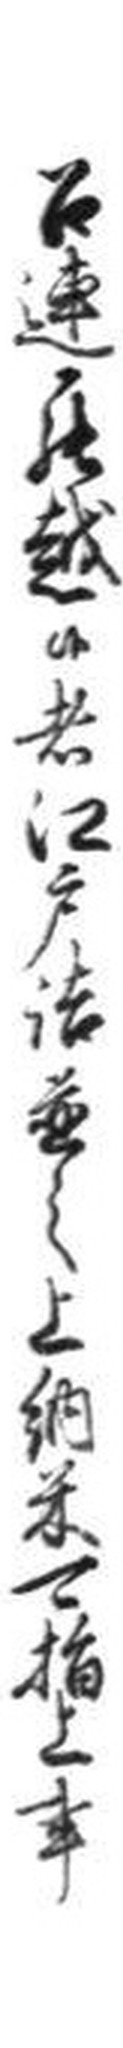召連罷越候者江戸詰並之上納米可指上事
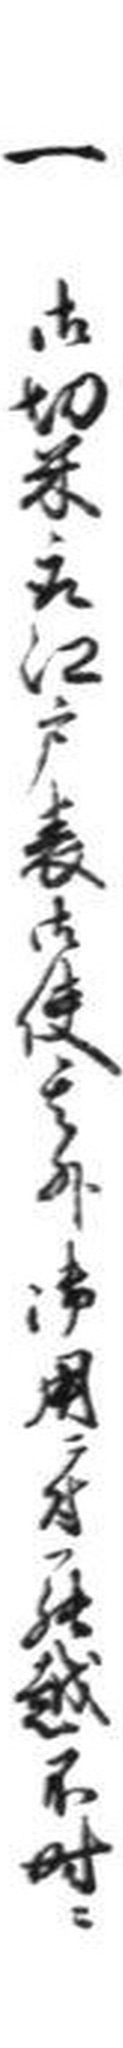一御切米取江戸表御使其外御用ニ付罷越不時ニ
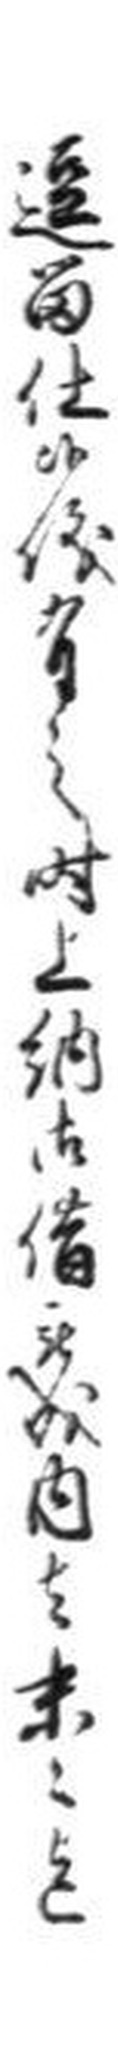逗留仕候儀有之時上納御借被成内者末々迄
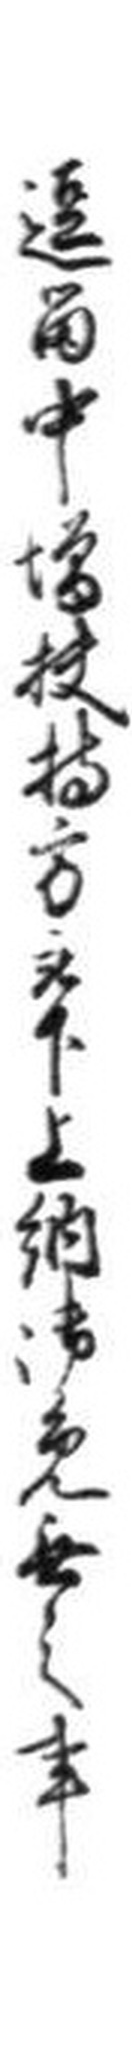逗留中増扶持方被下上納御免無之事
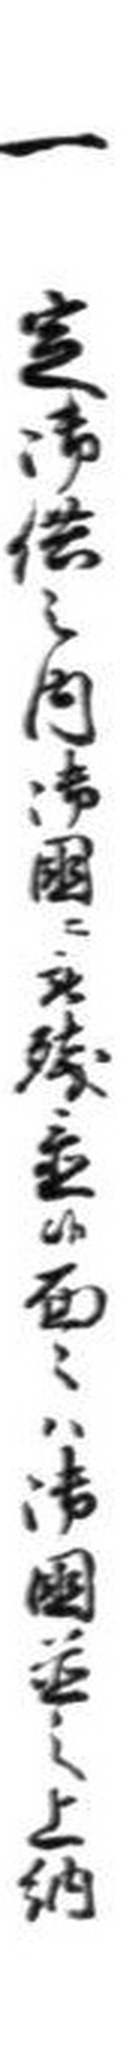一定御供之内御国ニ被残置候面々ハ御国並之
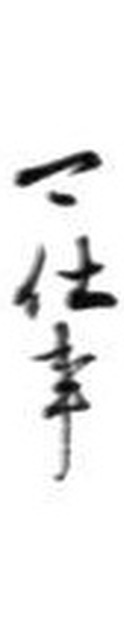可仕事
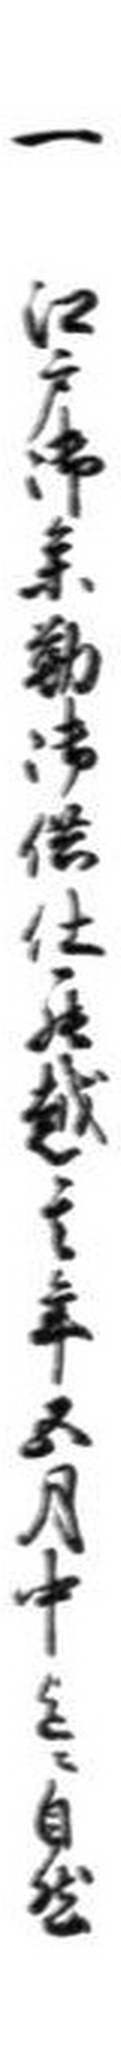一江戸御参勤御供仕罷越其年五月中迄ニ自然
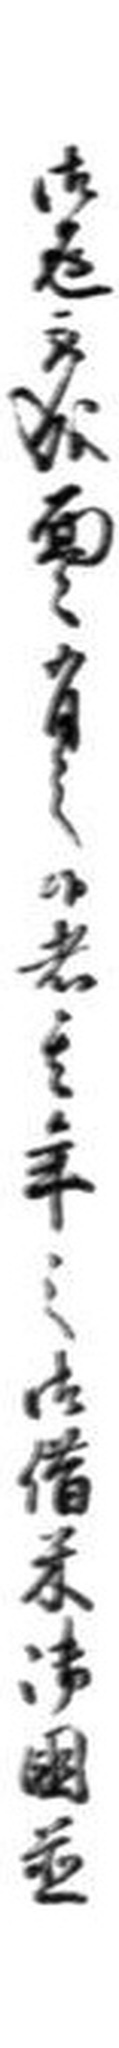御返被成面々有之候者其年之御借米御国並
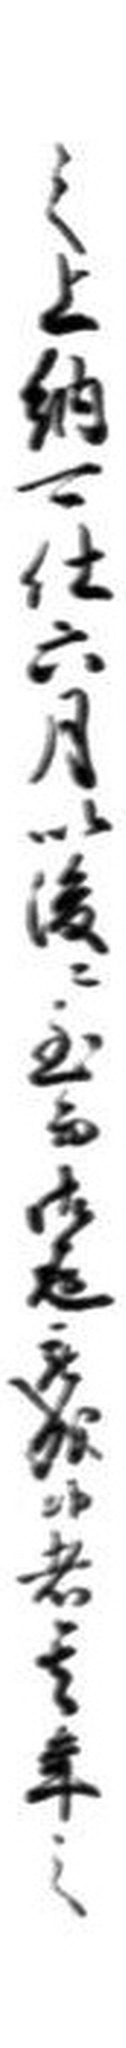之上納可仕六月以後ニ至而御返被成候者其年之
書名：家譜 三十一 吉邦公 享保元年
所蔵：福井県文書館 Fukui Prefectural Archives
